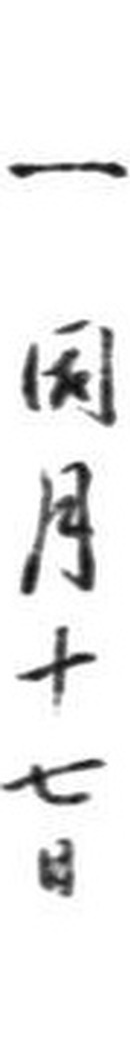一同月十七日
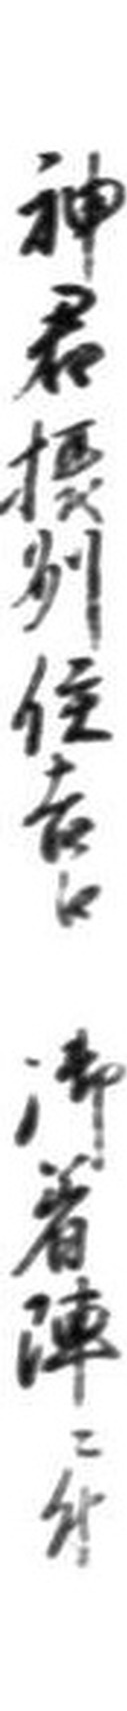神君摂州住吉江御着陣ニ付
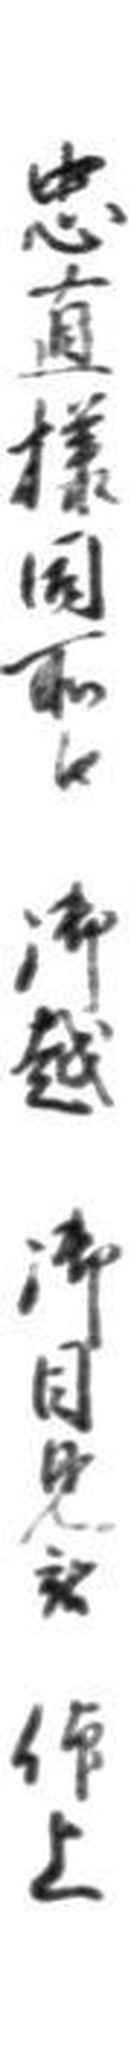忠直様同所江御越御目見被仰上
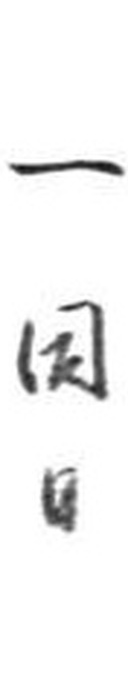一同日
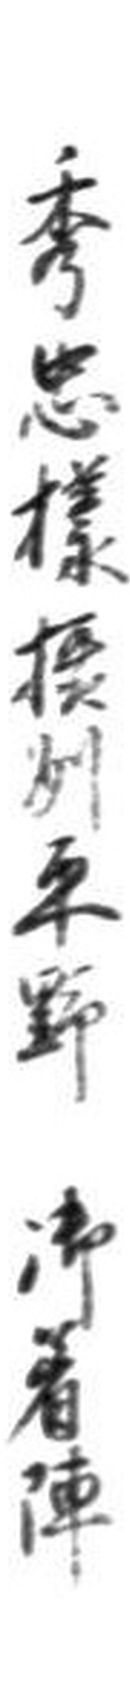秀忠様摂州平野御着陣
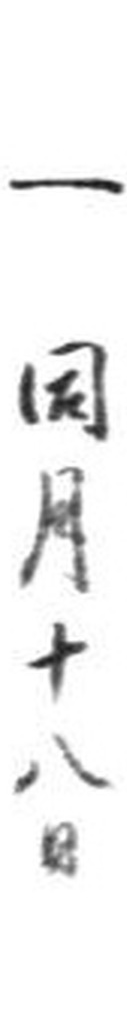一同月十八日
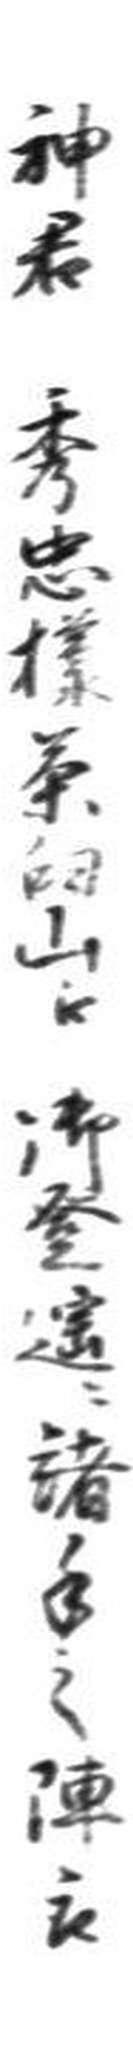神君秀忠様茶臼山江御登遥ニ諸手之陣取
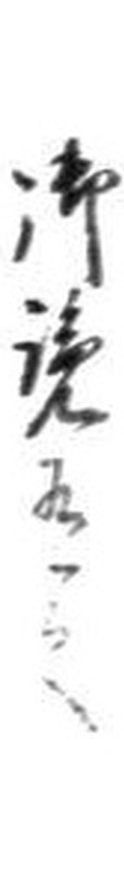御覧有之

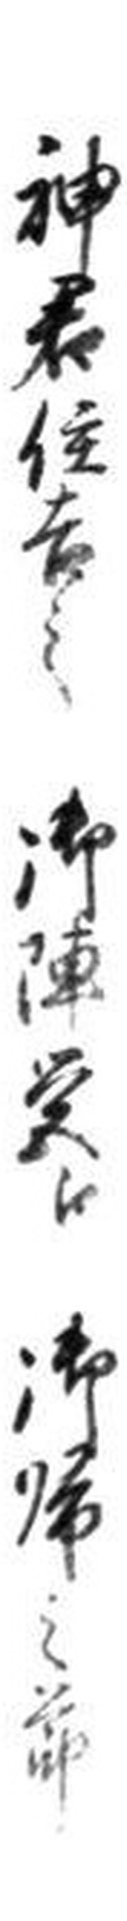神君住吉之御陣営江御帰之節
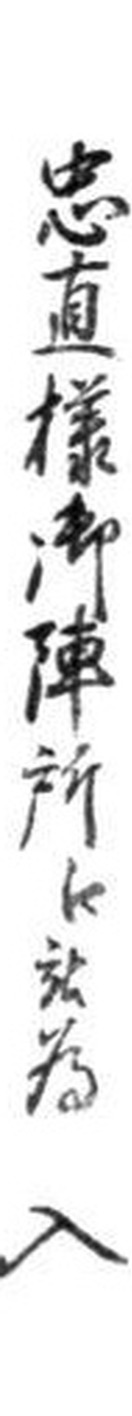忠直様御陣所江被為入
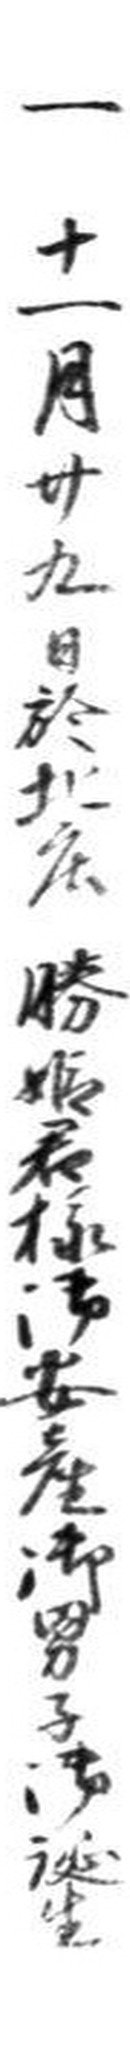一十一月廿九日於北庄勝姫君様御安産御男子御誕生
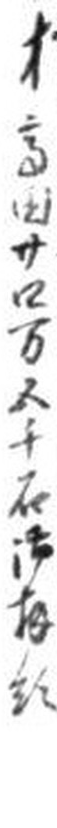高田廿四万五千石御拝領
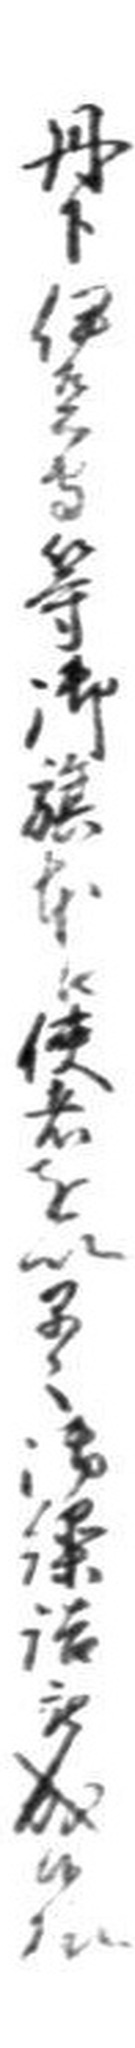丹下伊豆守等御旗本江使者を以早々御繰詰被成候様
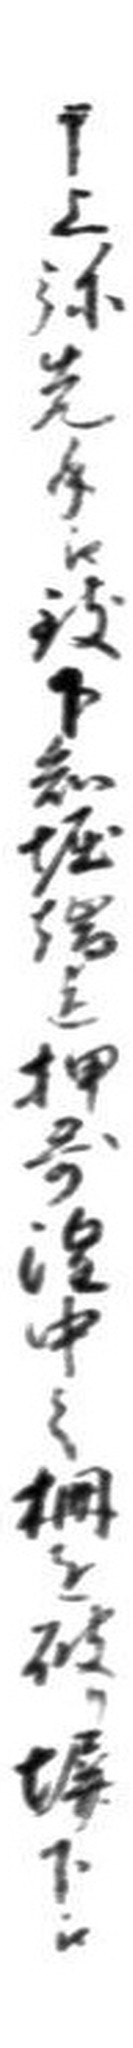申上弥先手江致下知堀瑞迄押寄湟中之柵を破り塀下江
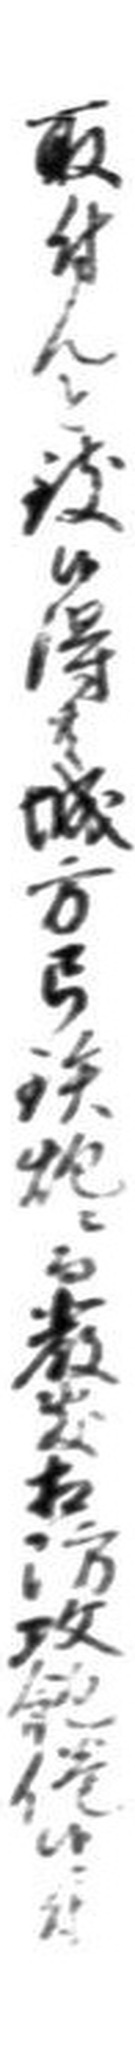取付んと致候得共城方弓鉄炮ニ而厳敷相防攻飽倦候ニ付
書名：家譜 二 忠直公 従文禄四年到慶安四年
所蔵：福井県文書館 Fukui Prefectural Archives
